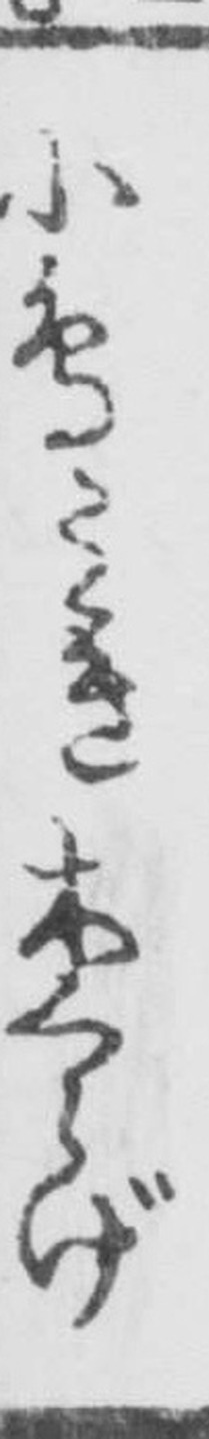小鳥たゝき木くらげ

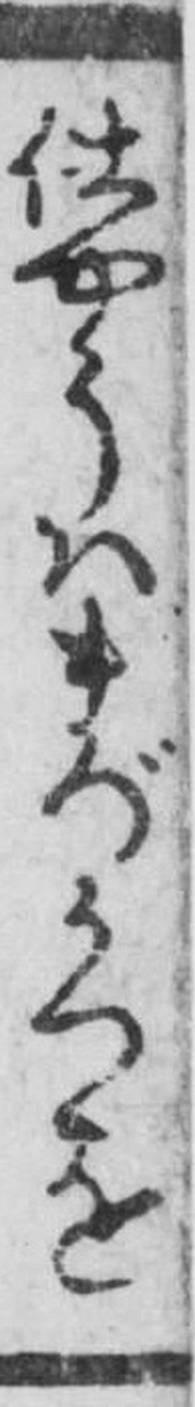仕やうはまづかつを
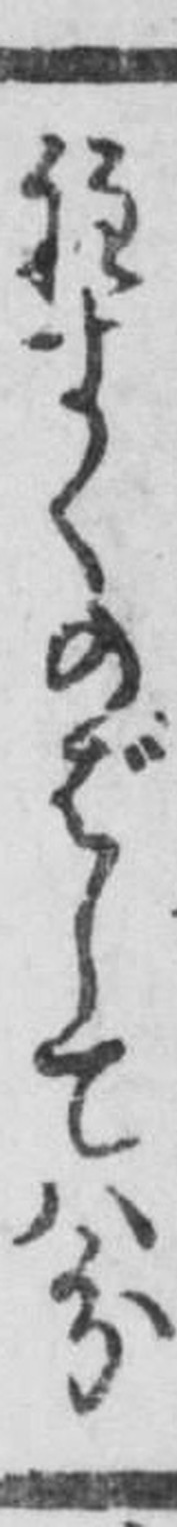程よくのばして八分
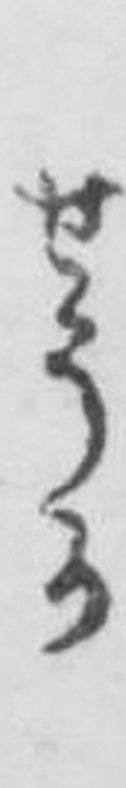せうか
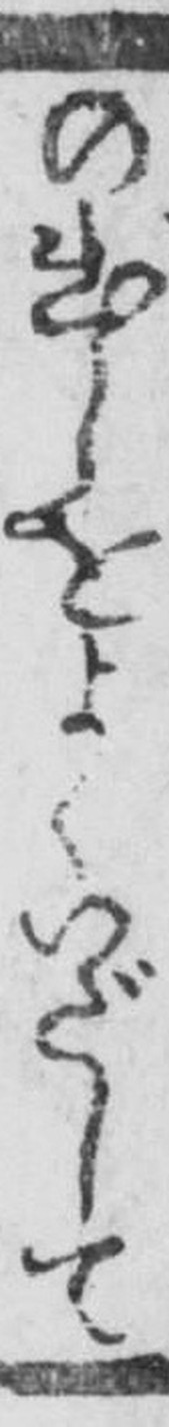の出しをよくいだして
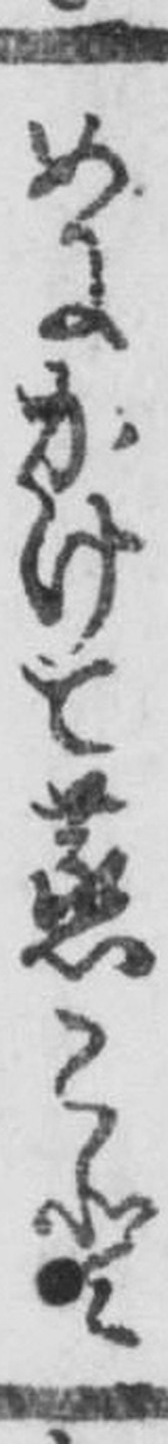めにかけて蒸こと
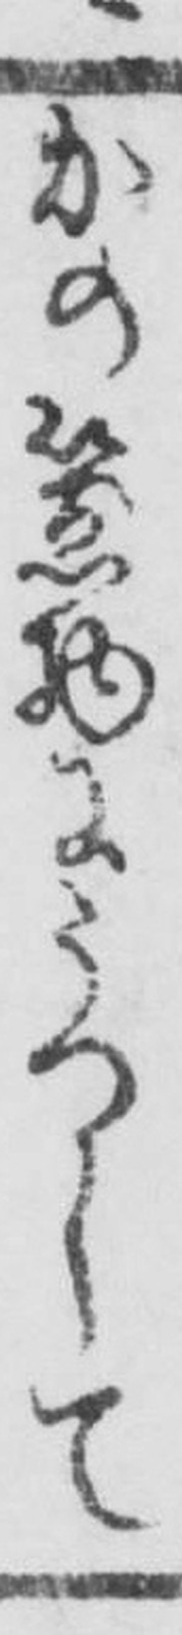かの蓋物にうつして
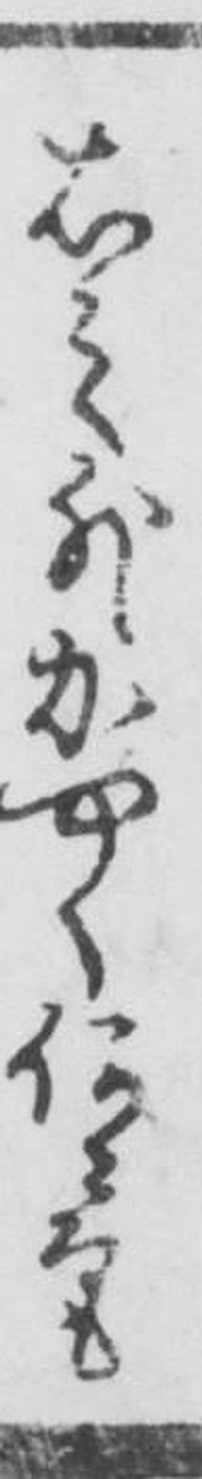右之外かやく何にても
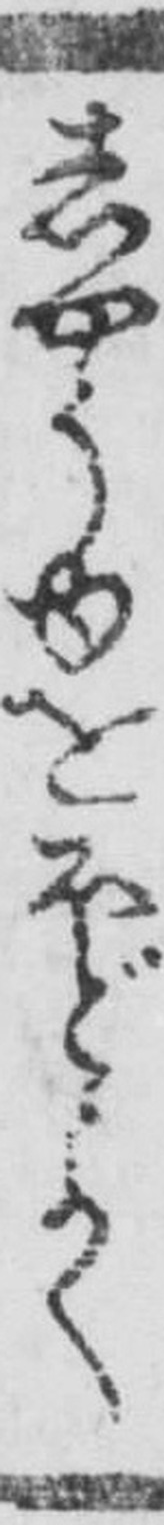しやうゆをほどよく
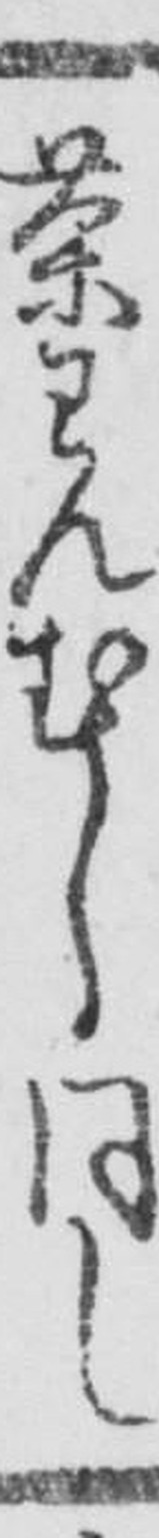茶わんむし同し
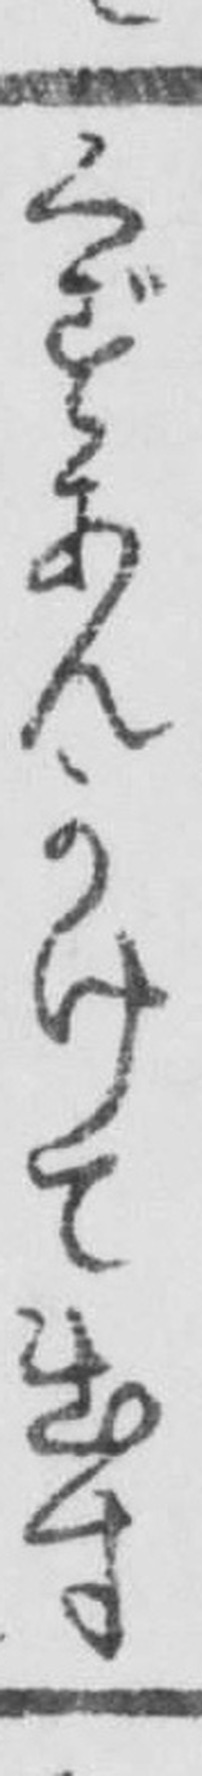くずあんかけて出す
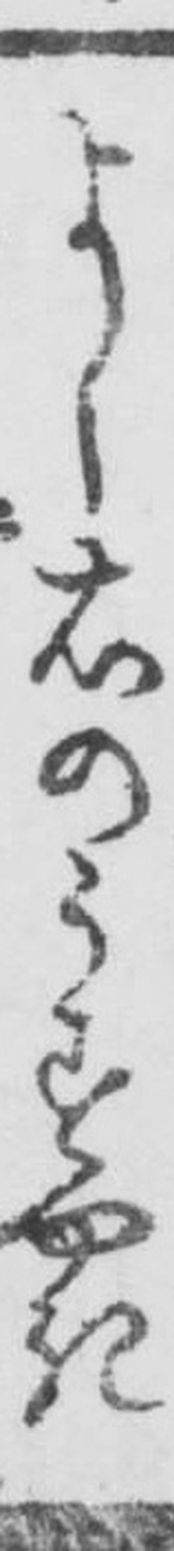よし右のうすやき
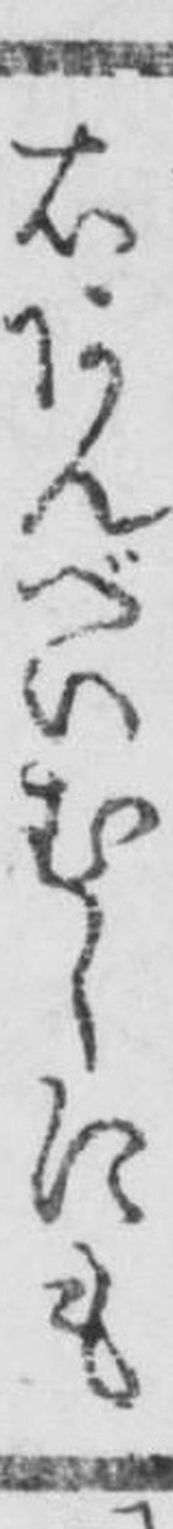右あんべいむしにも
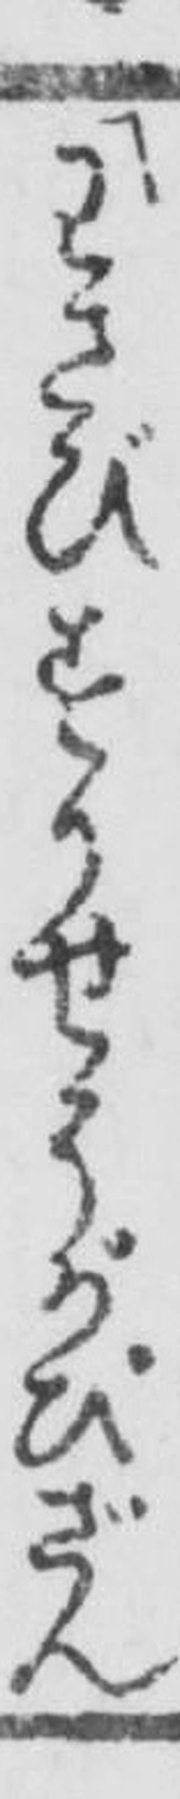〽わさびすりせうがひざん
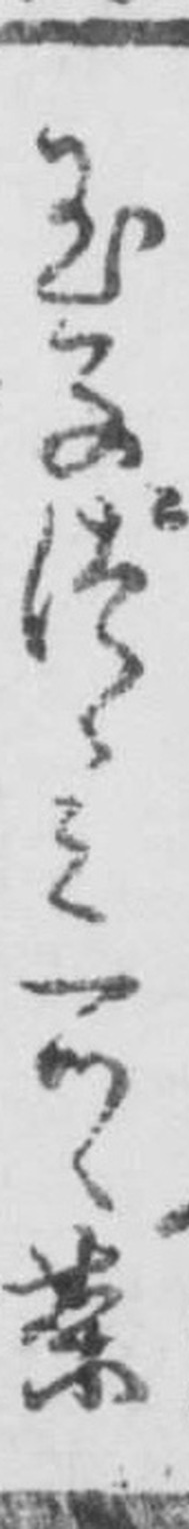玉子につゝみ一つゝ茶
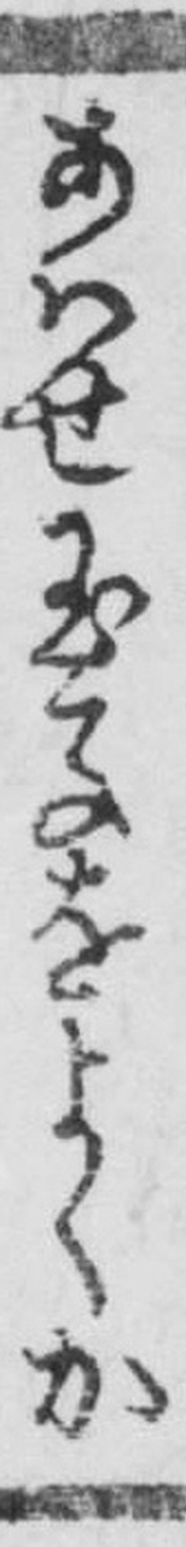あはせ玉子をよくか
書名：諸家通用/即席料理
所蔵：大阪府立大学学術情報センター 国文学研究資料館
